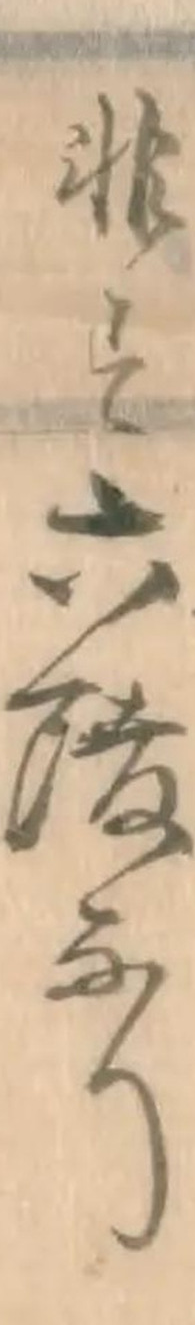非す六陵なり
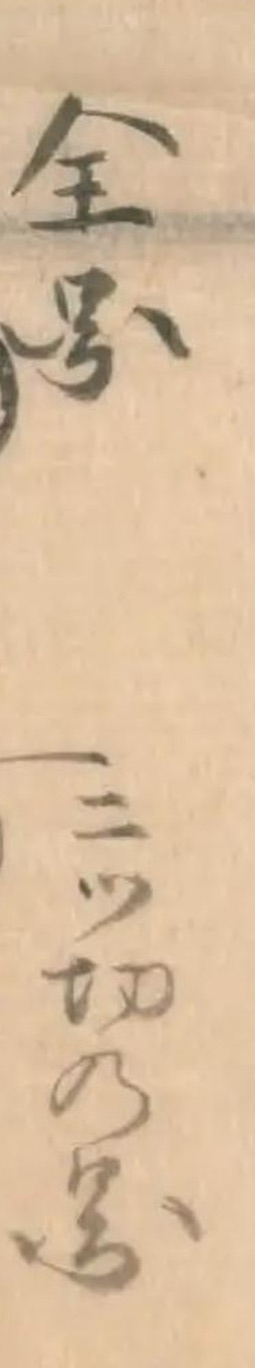全図二ツ切の図

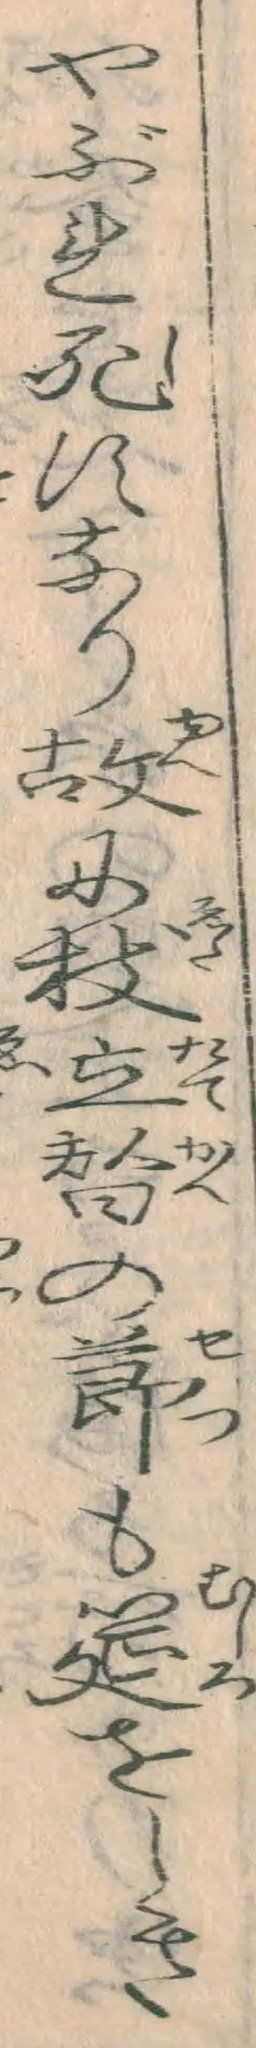やぶれ死すなり故に枝立替の節も筵をしき
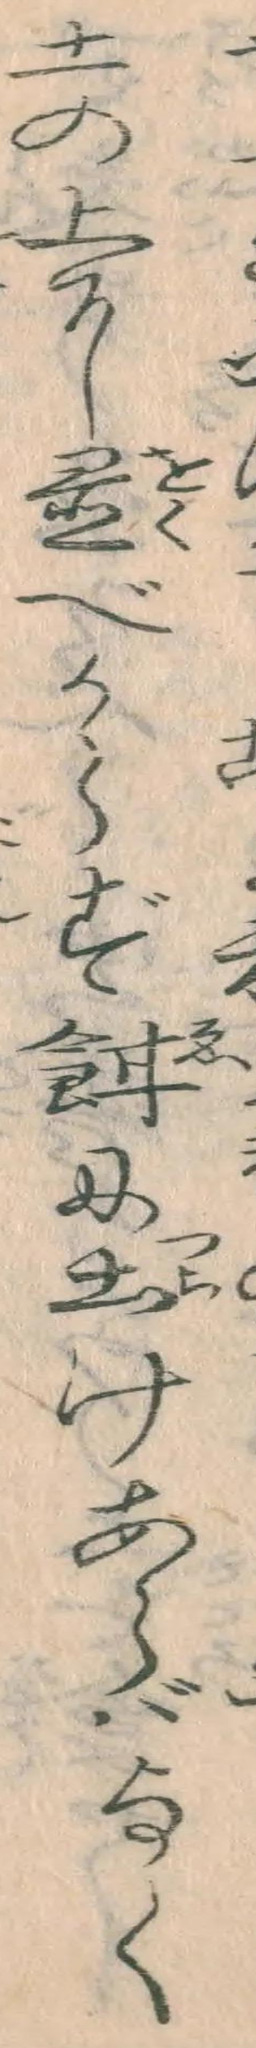土の上に置べからず餌に土けあらばよく
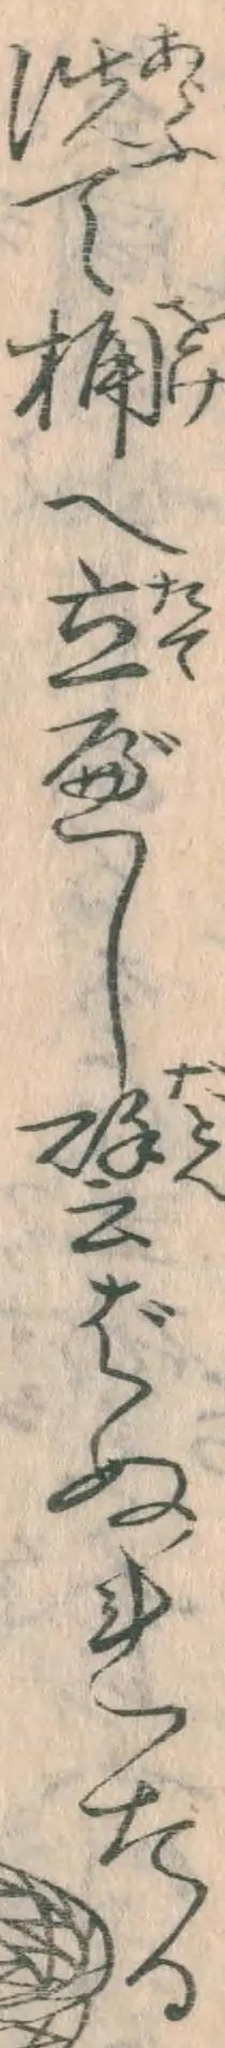洗て桶へ立べし譬ばぬれたる
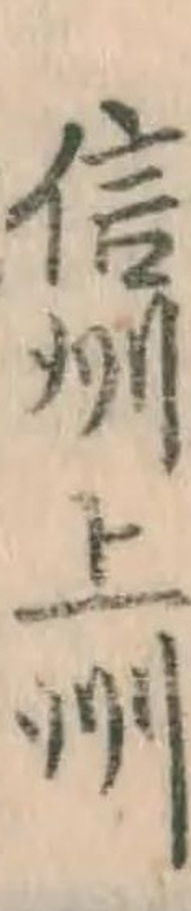信州上州
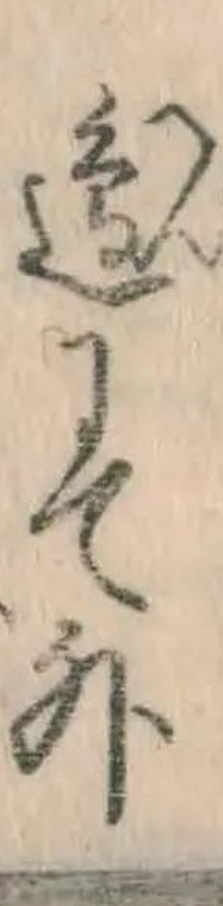辺にて外
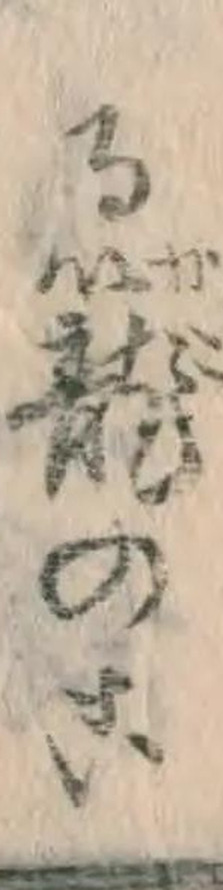る籠のこ
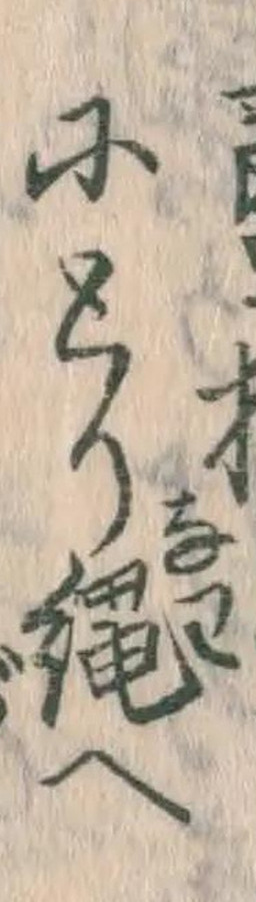にとり縄へ
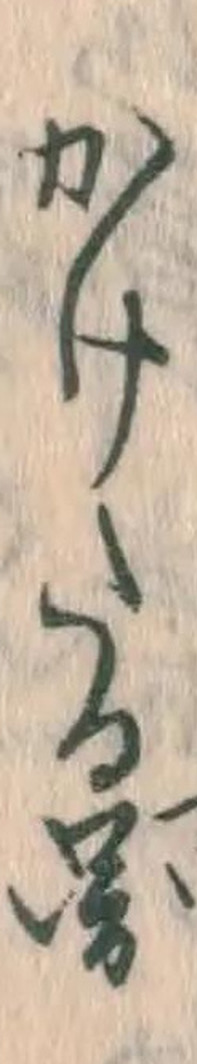かけたる図
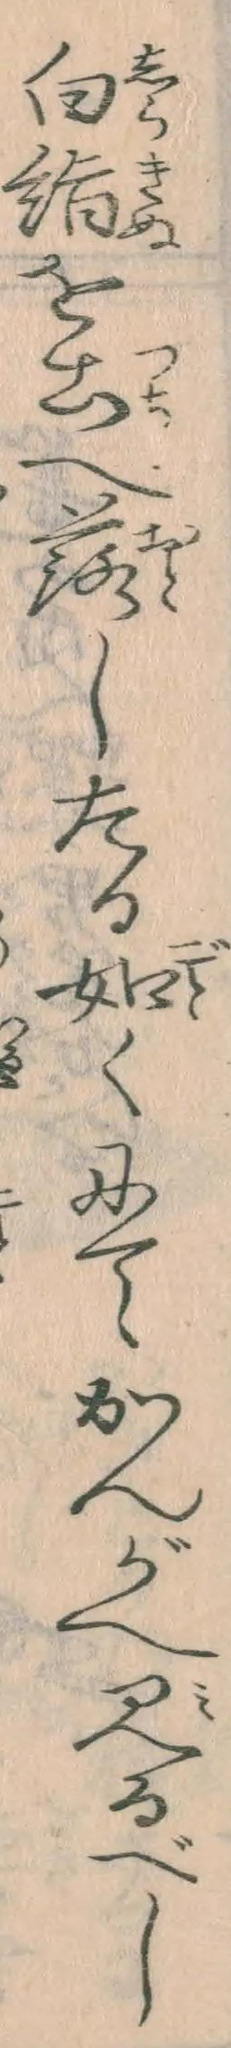白絹を土へ落したる如くにてかんがえ見るべし
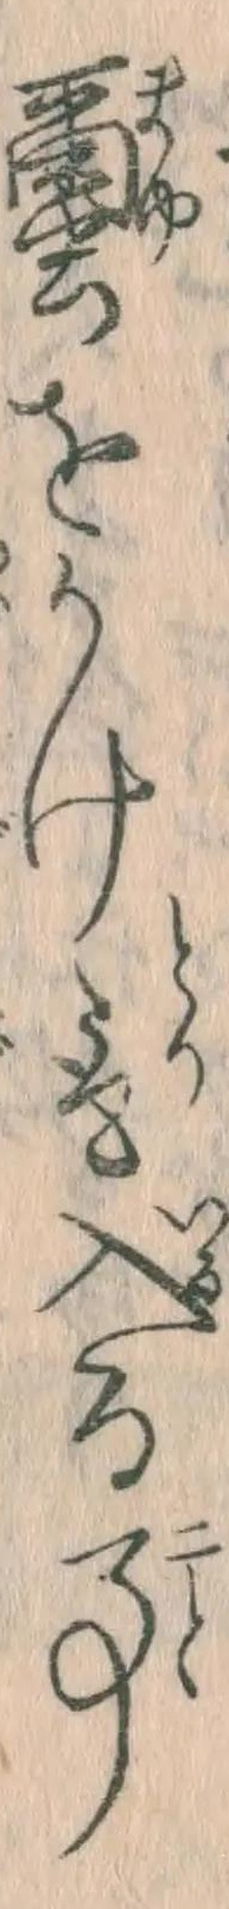繭をかけ取入る事
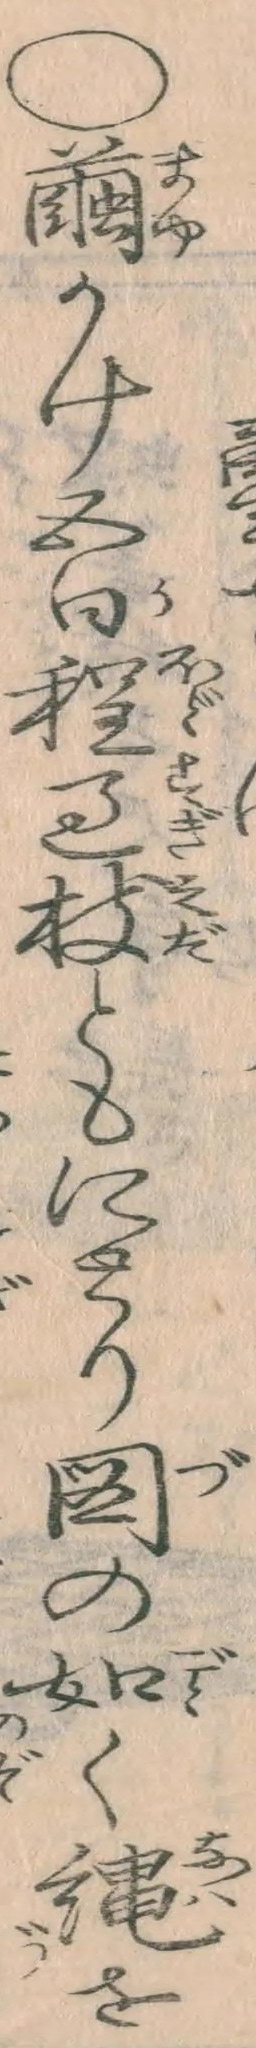○繭かけ五日程過枝ともにとり図の如く縄を
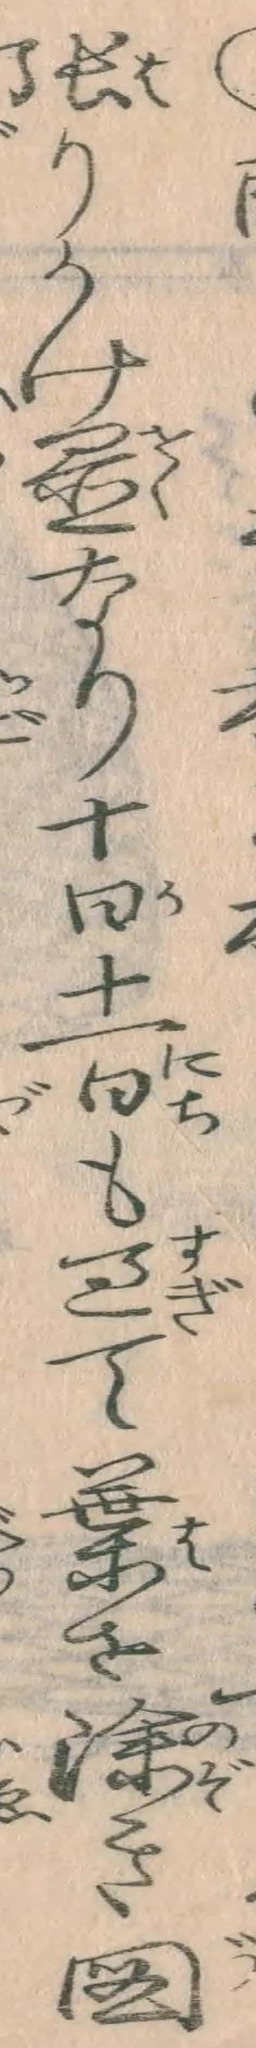張りかけ置なり十日十一日も過て葉を除き図
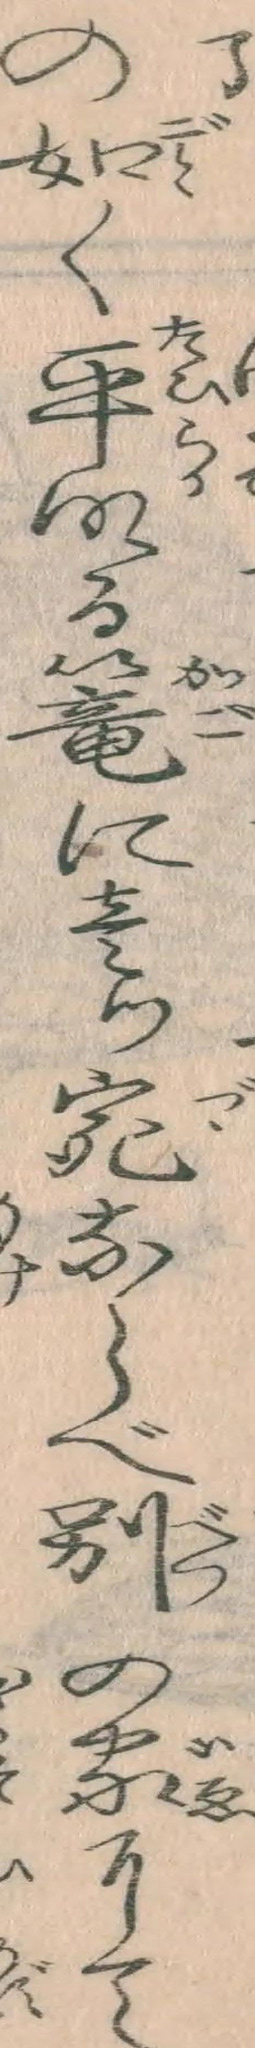の如く平なる篭に壱ツ宛ならべ別の家にて
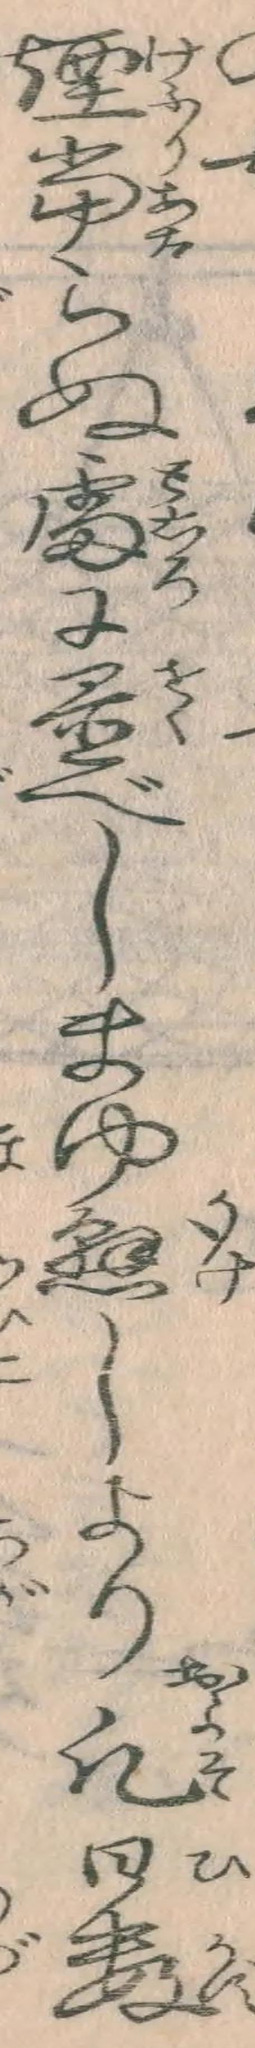煙当らぬ処に置べしまゆ懸しより凡日数
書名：山繭養法秘傳抄
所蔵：国立国会図書館 National Diet Library, JAPAN
